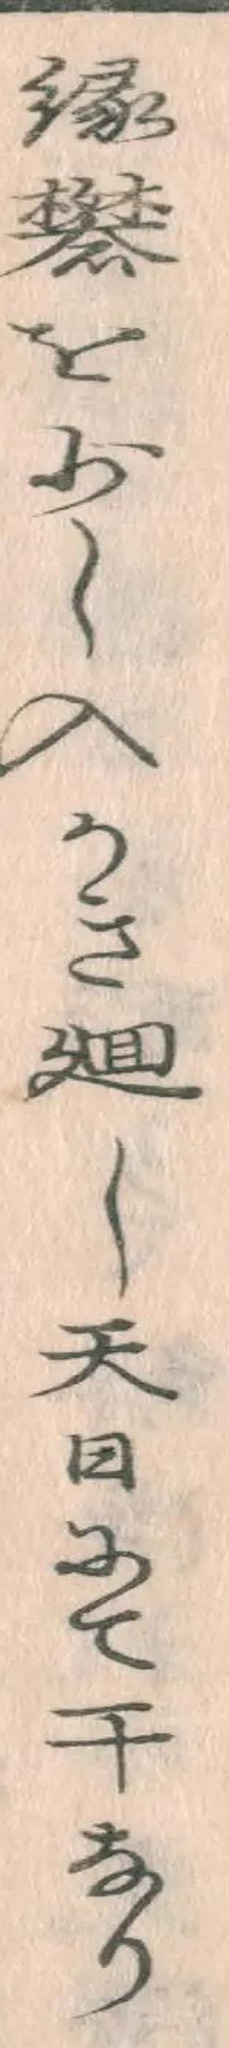緑礬を少し入かき廻し天日にて干なり
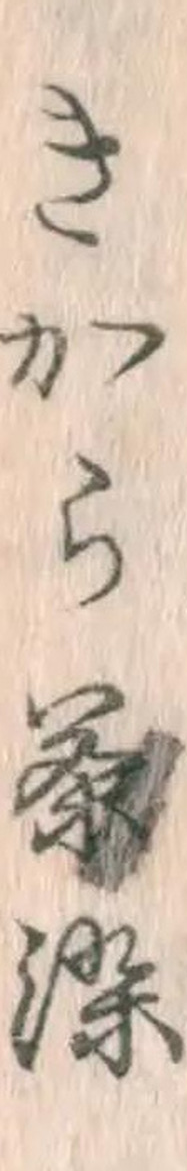きから茶染
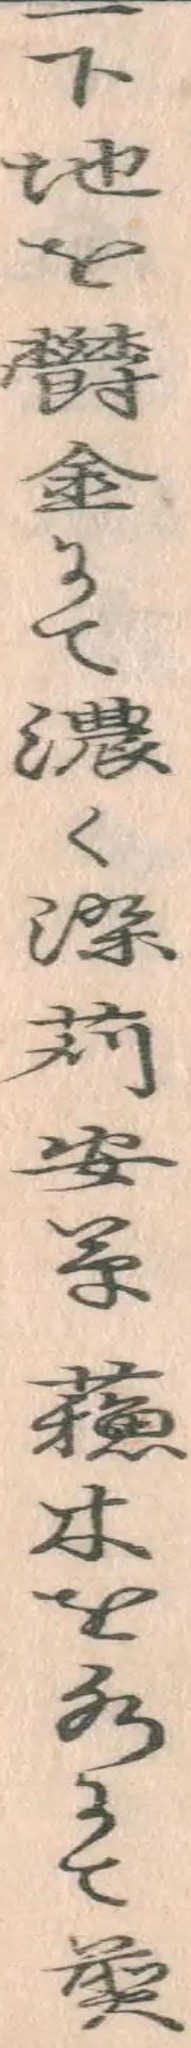一下地を鬱金にて濃く染苅安草蘓木を水にて煎
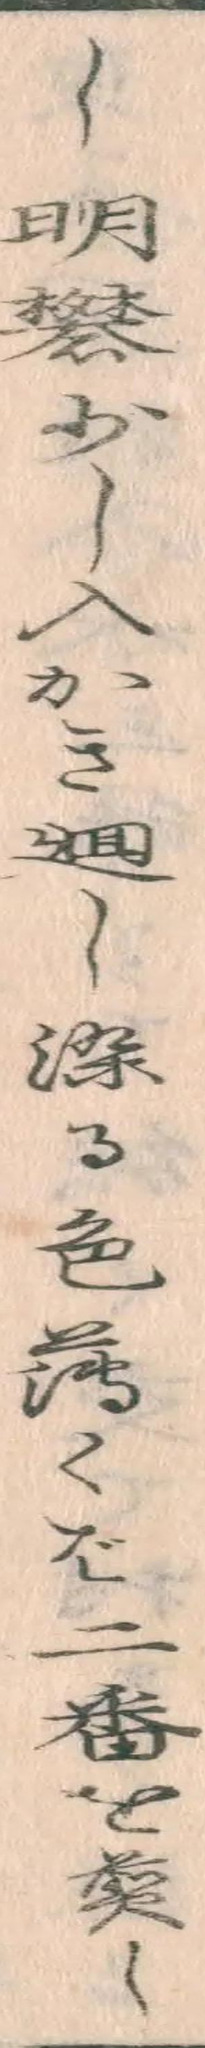し明礬少し入かき廻し染る色薄くば二番を煎し
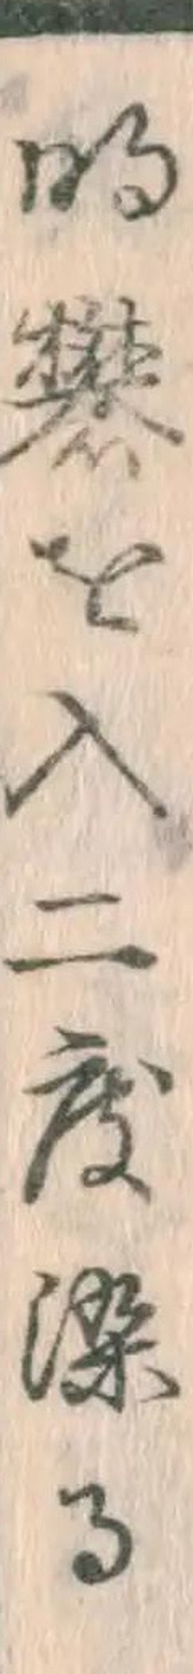明礬を入二度染る
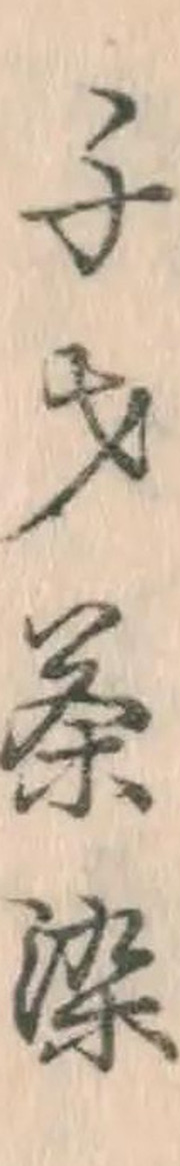千才茶染
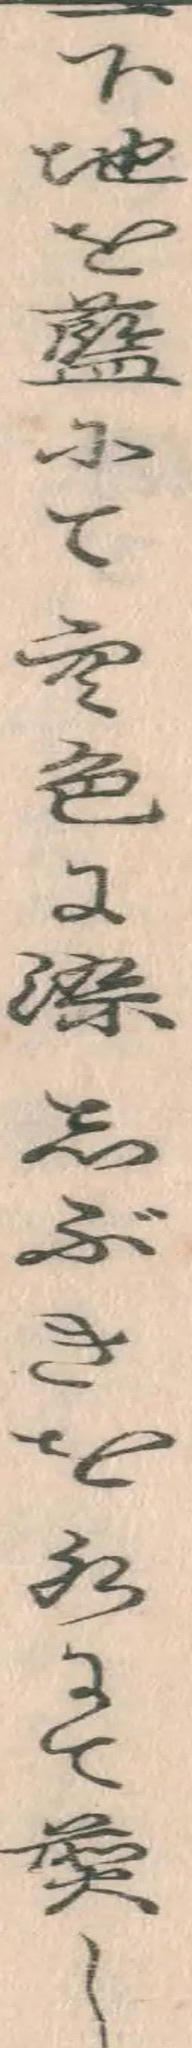一下地を藍にて空色に染しぶきを水にて煎し
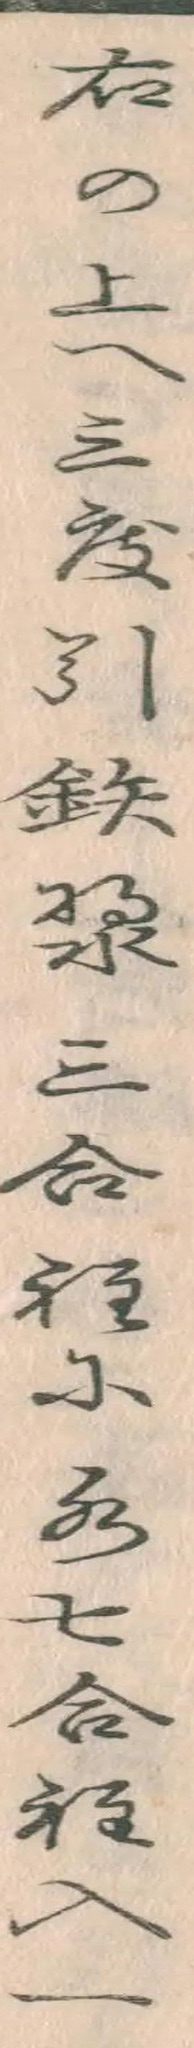右の上へ三度引鉄漿三合程に水七合程入一
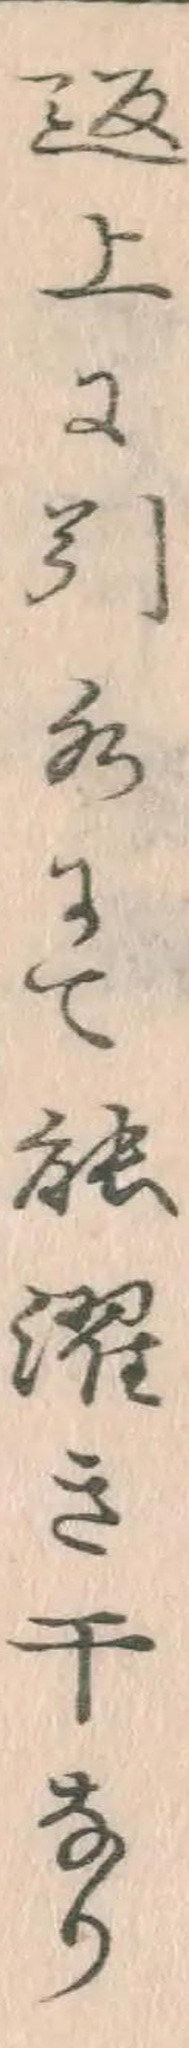返上に引水にて能濯き干なり
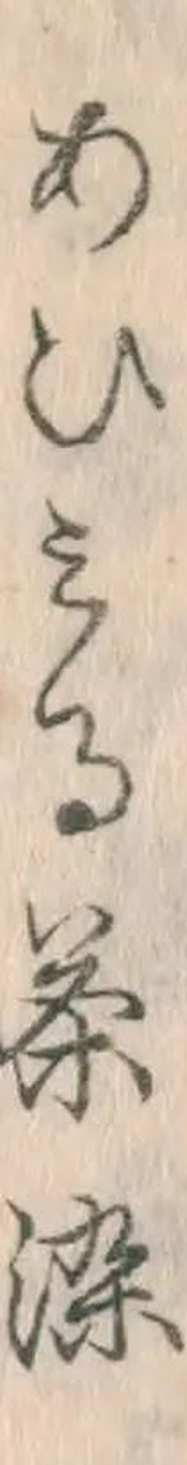あひみる茶染
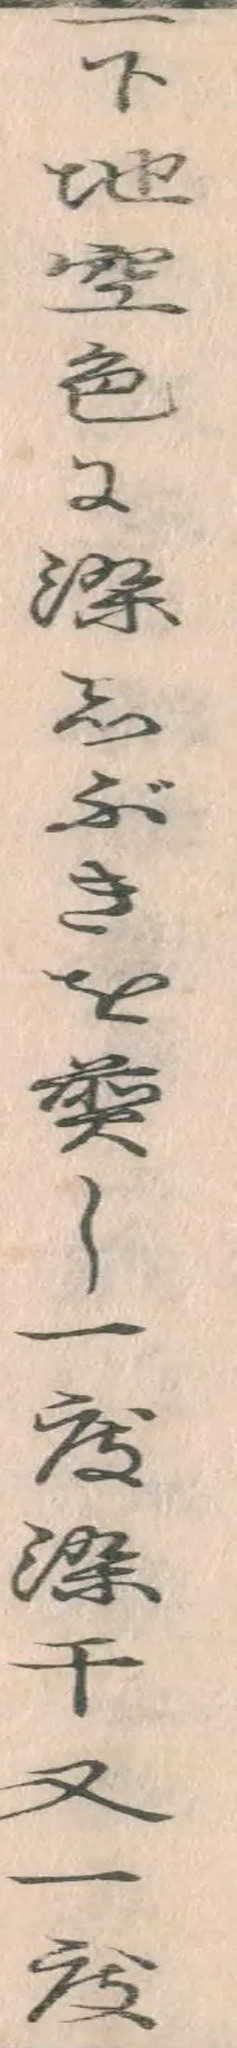一下地空色に染しぶきを煎し一度染干又一度
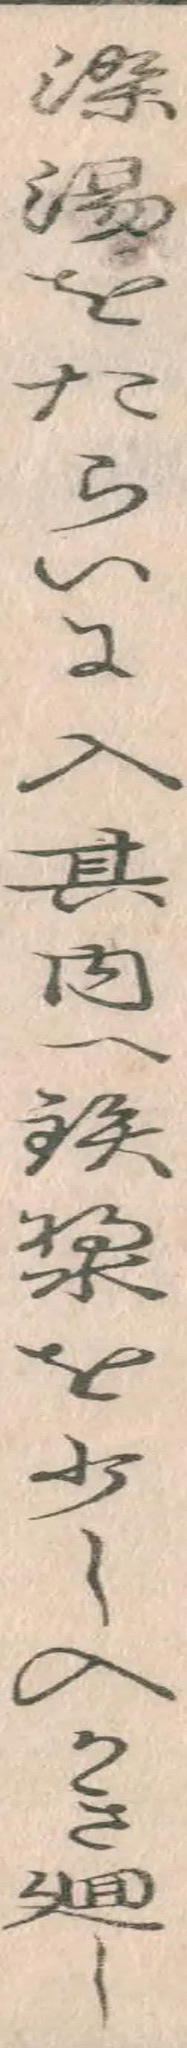染湯をたらいに入其内へ鉄漿を少し入かき廻し
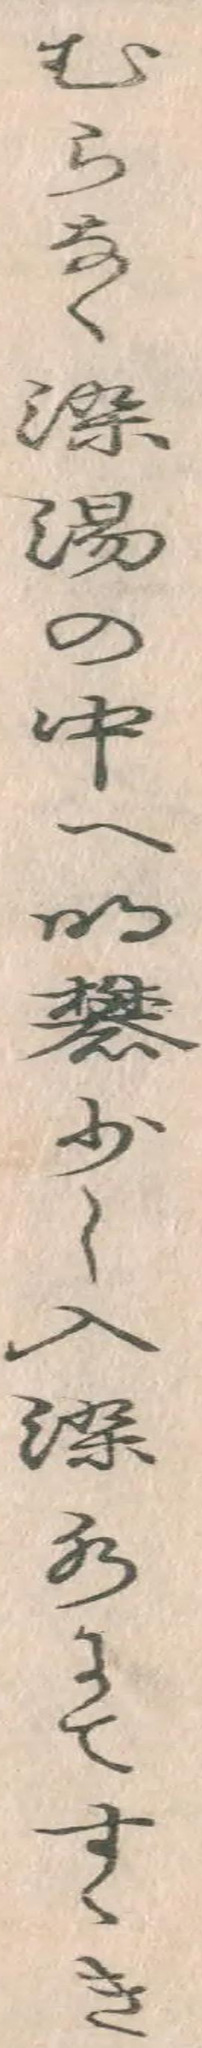むらなく染湯の中へ明礬少し入染水にてすゝき
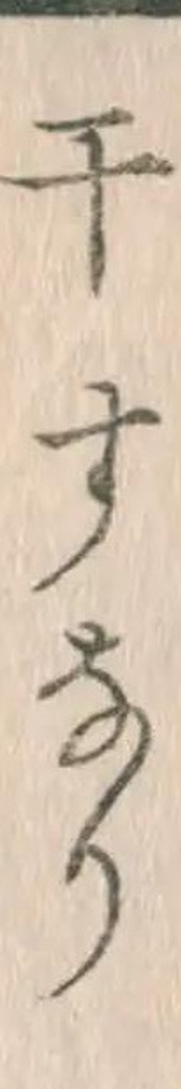干すなり
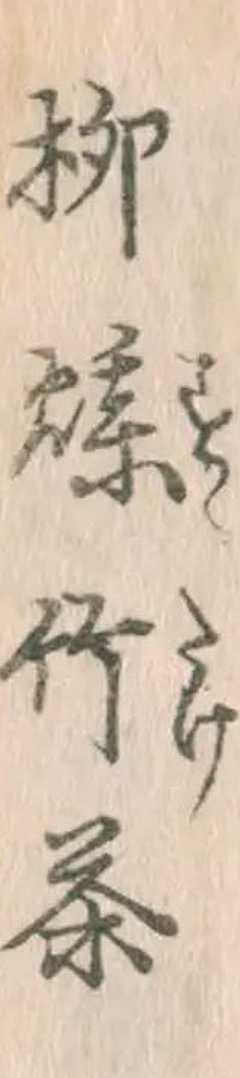柳煤竹茶
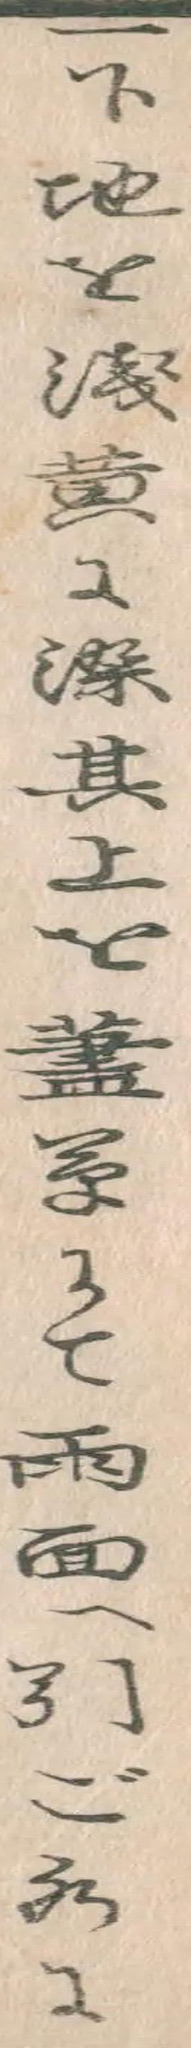一下地を浅黄に染其上を藎草にて両面へ引ご水に
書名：機織彙編 5巻. [1]
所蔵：国立国会図書館 National Diet Library, JAPAN
